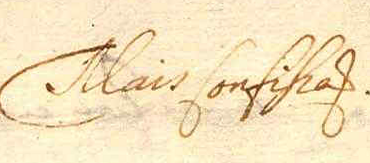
Mais Confissaõ.
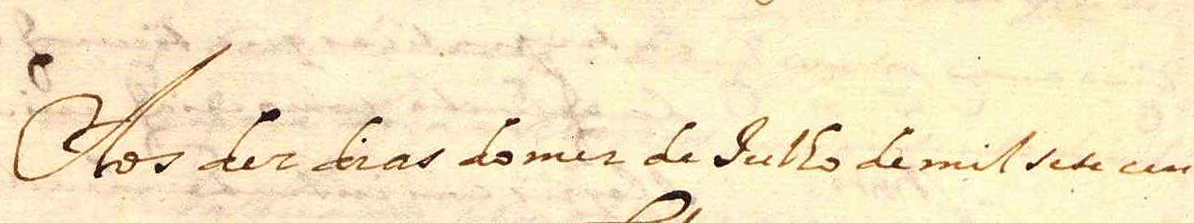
Aos dez dias do mez de Iulho de mil setecen
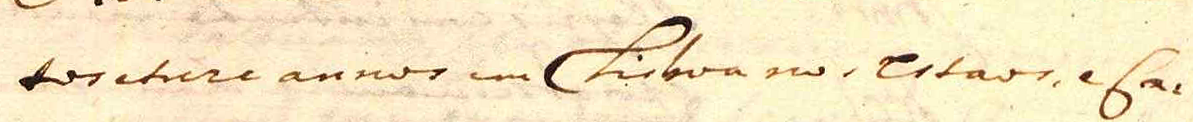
tos e treze annos em Lisboa nos Estaos, e Ca
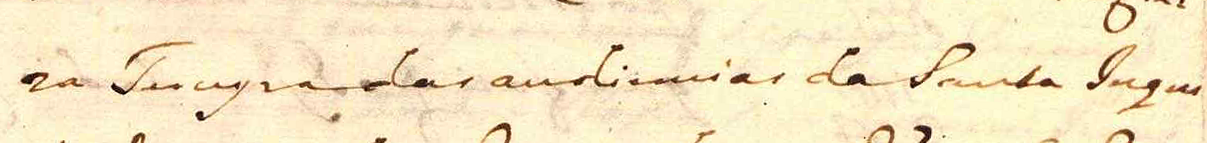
za Terceyra das audiencias da Santa Inqui
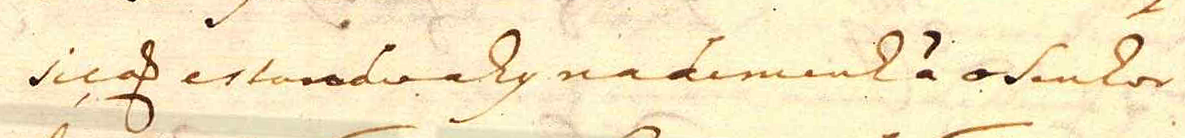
siçaõ estando ahy na de menhã o Senhor
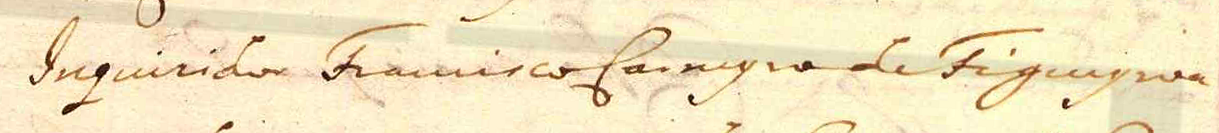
Inquizidor Francisco Carneyro de Figueyroa
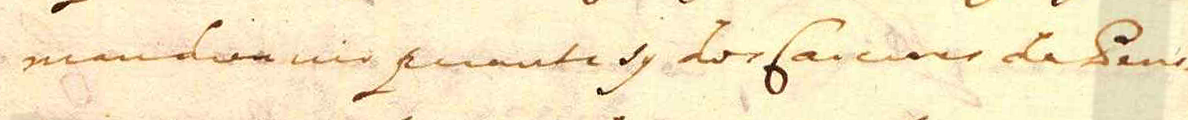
mandou uir perante sy dos Carceres da Peni
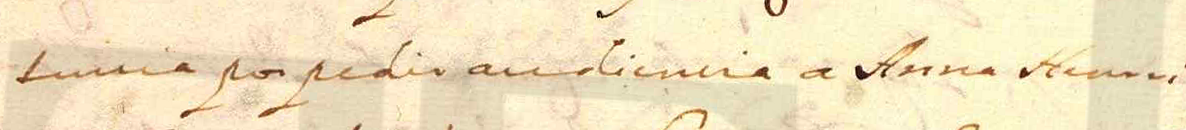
tencia por pedir audiencia a Anna Henrri
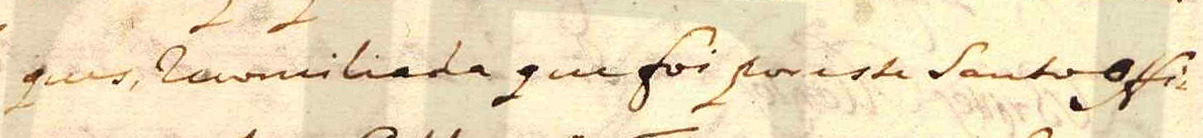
ques, Reconciliada que foi por este Santo offi
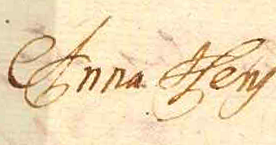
Anna Hen̄s
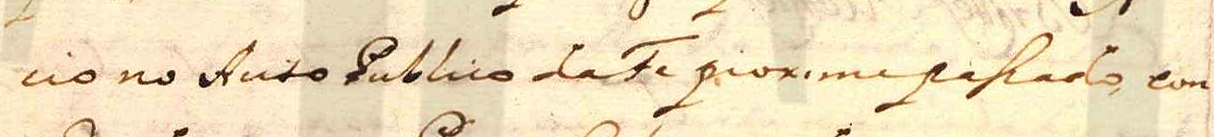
cio no Auto Publico da Fe proxime passado, con
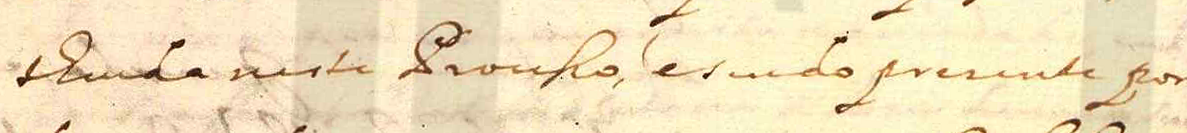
theuda neste Processo, e sendo prezente por
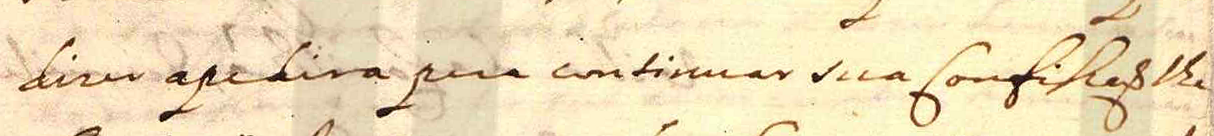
dizer a pedira pera continuar sua Confissaõ lhe
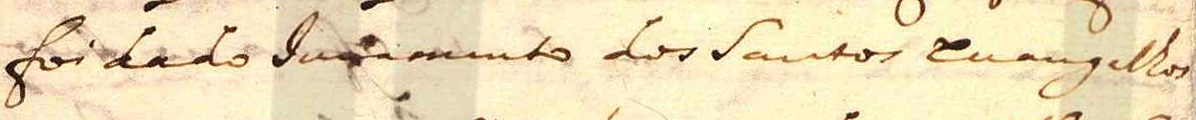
foi dado Iuramento dos Santos euangelhos
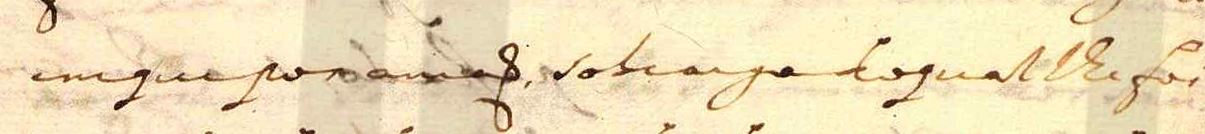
em que pos a maõ, sob cargo do qual lhe foi
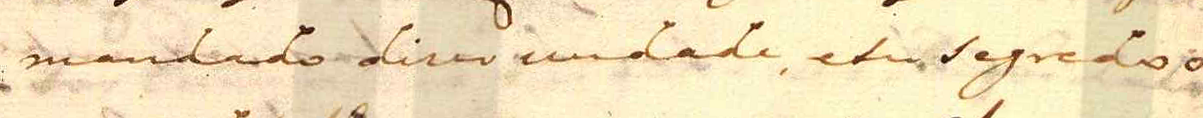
mandado dizer uerdade, e ter segredo o
